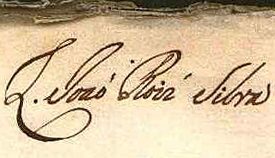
L. Ioaõ Roiz̄ Silva
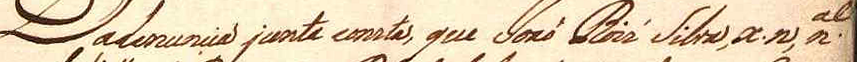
Da denunçia junta consta, que Ioaõ Roiz̄ Silva, x.n, nal.
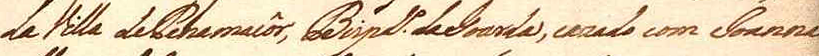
da Villa de Penamacôr, Bispd.o da Guarda, cazado com Ioanna
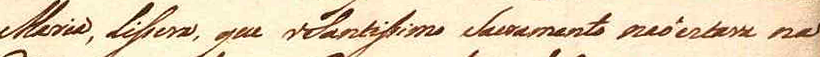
Maria, dissera que o Santissimo Iuramento naõ estava na
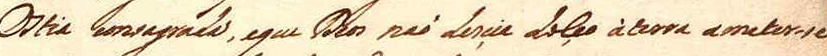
Ostia consagrada, e que Deos naõ desçia do Çeo à terra a meter-se
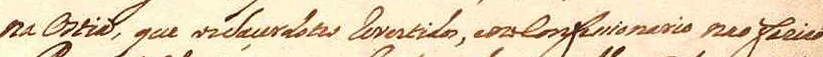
na Ostia, que os Saçerdotes Revestidos, e no Confissionario nao faziaõ
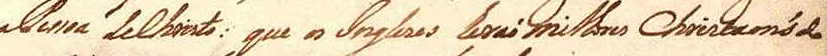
a Pessoa de Christo: que os Inglezes heraõ milhores Christaons̄ do
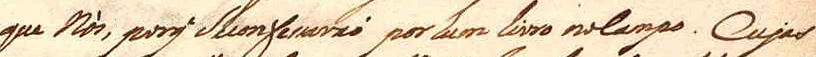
que Nòs, porq̄ Se confessavaõ por hum livro no Campo. Cujas
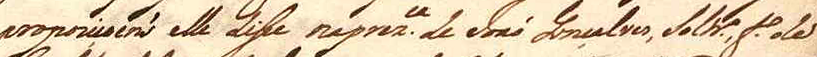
propoziçoens̄ elle disse na prez.ca de Ioaõ Gonçalves, Soltr.o f.o de
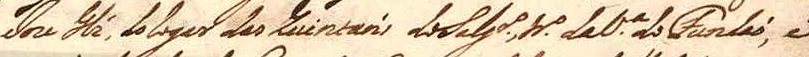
Ioze Glz̄, do Logar das Quintans̄ do Salgr.o, tr.o da V.a do Fundaõ, e
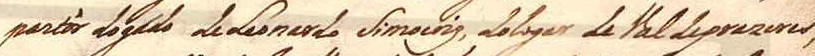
pastôr do gado de Leonardo Simoenz̄, do logar de Val de prazeres;
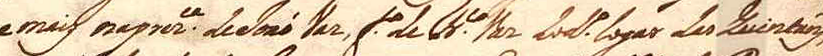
e mais na prez.ca de Ioaõ Vaz, f.o de Fr.co Vaz do d.o logar das Quintans,
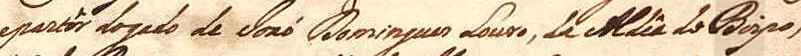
e pastôr do gado de Ioaõ Domingues Louro, da Aldêa do Bispo,
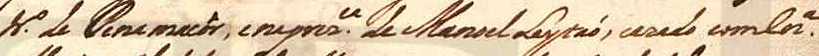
tr.o de Penamacôr, e na prez.ca de Manoel Leytaõ, cazado com Cn.a
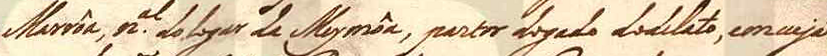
Marrôa, n.al do logar de Maymôa, pastor do gado do delato, em cuja
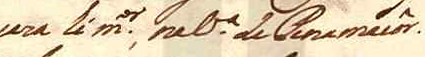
caza hé m.or, na V.a de Penamacôr.
